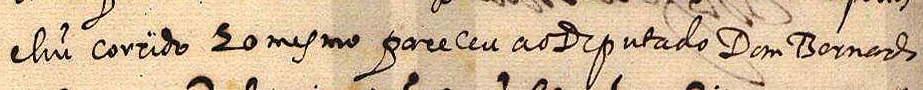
e hū corrido E o mesmo pareceu ao Deputado Dom Bernardo
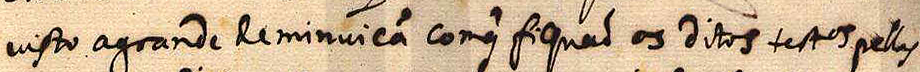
uisto a grande deminuicā com q̄ fiquaõ os ditos testos pellas
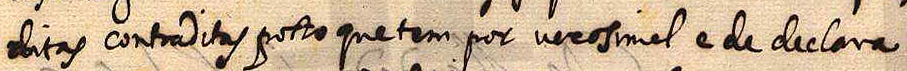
ditas contraditas posto que tem por uerosimel, e de declara
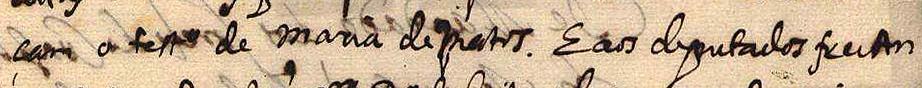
çam o testo de maria de matos. E aos deputados frei An
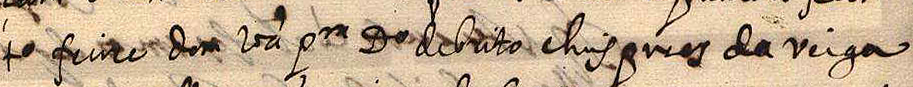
to freire dom Ioā pra Do de brito e luis pires da Veiga
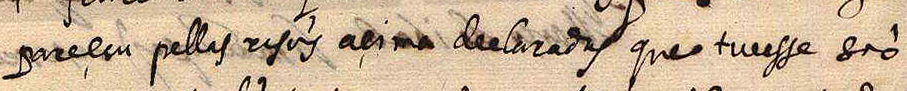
pareceu pellas resoĩs açima declaradas que tiuesse soo
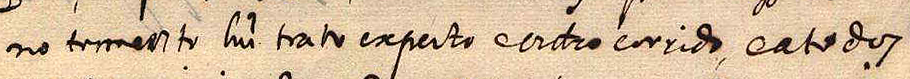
no tormento hū trato experto, e outro corrido, e a todos
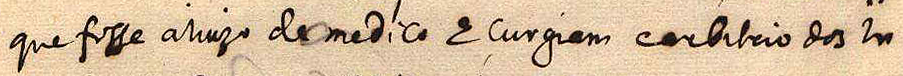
que fosse a Iuizo de medico E curgiam e arbitrio dos In
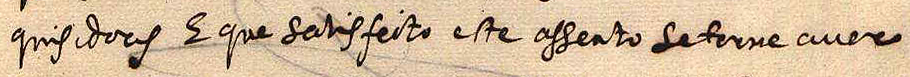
quisidores E que satisfeito este assento se torne a uer
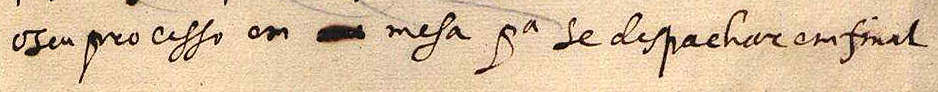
o seu processo em _ mesa pa se despachar em final
